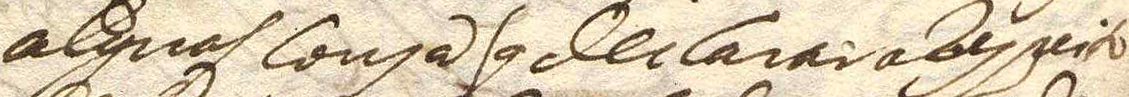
alguā cousa q̄ declarar a Respeito
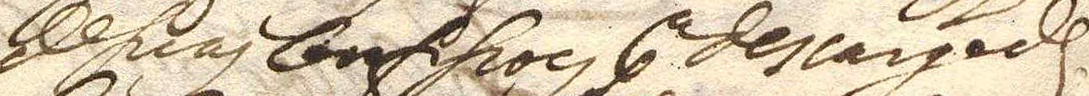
de suas confissoes pa descargo de
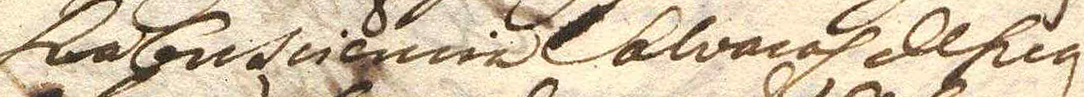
sua consciencia Salvaçaõ de sua
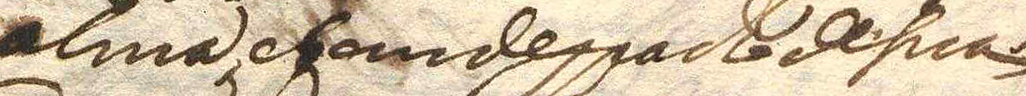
alma, e bom despacho de sua
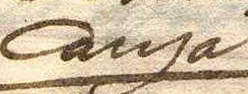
causa
